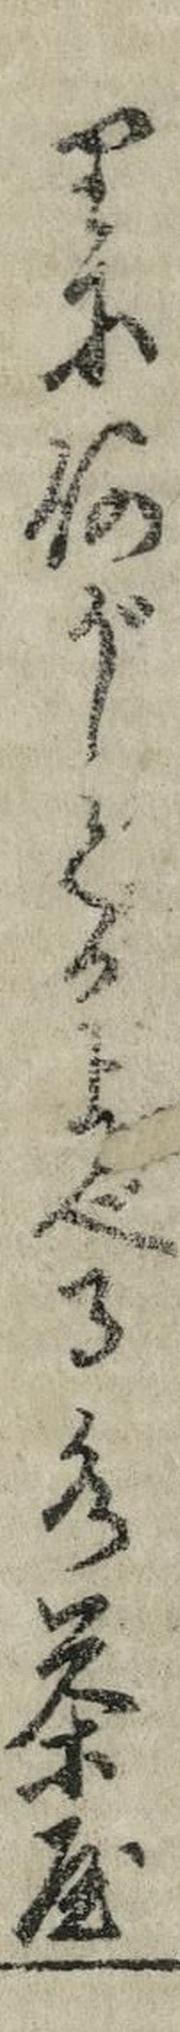りに何がしとかよべる水茶屋
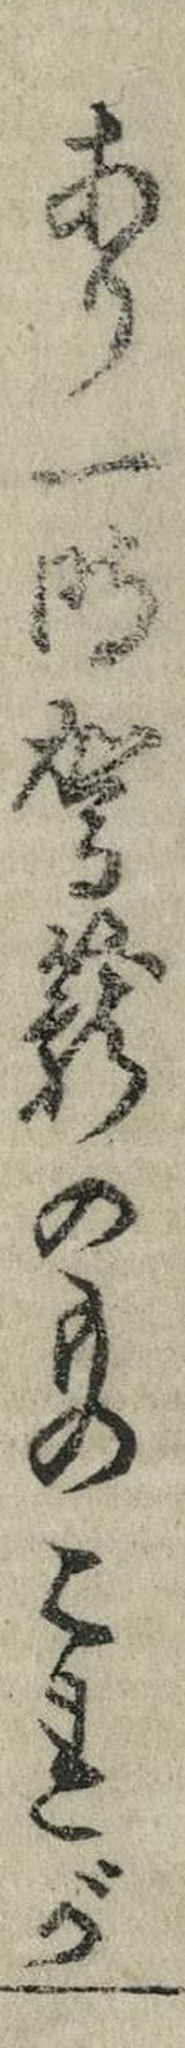あり一時駕籠のものこれが
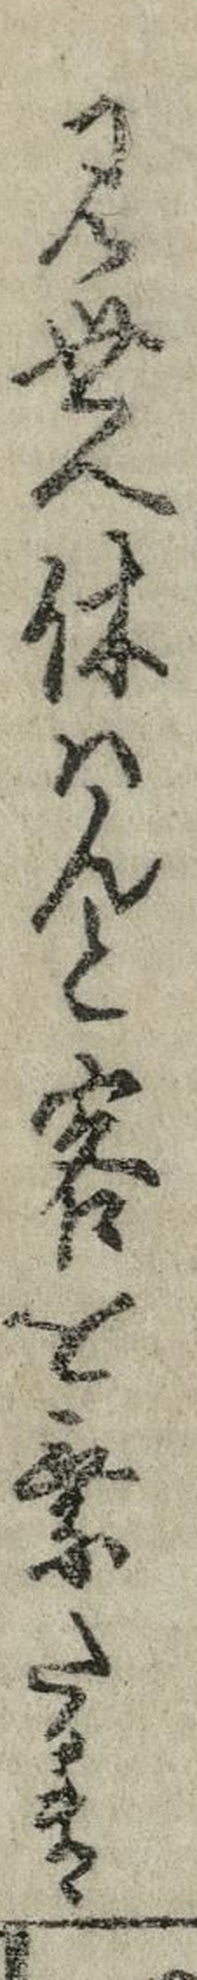見世へ休はんと客を乗たまゝ
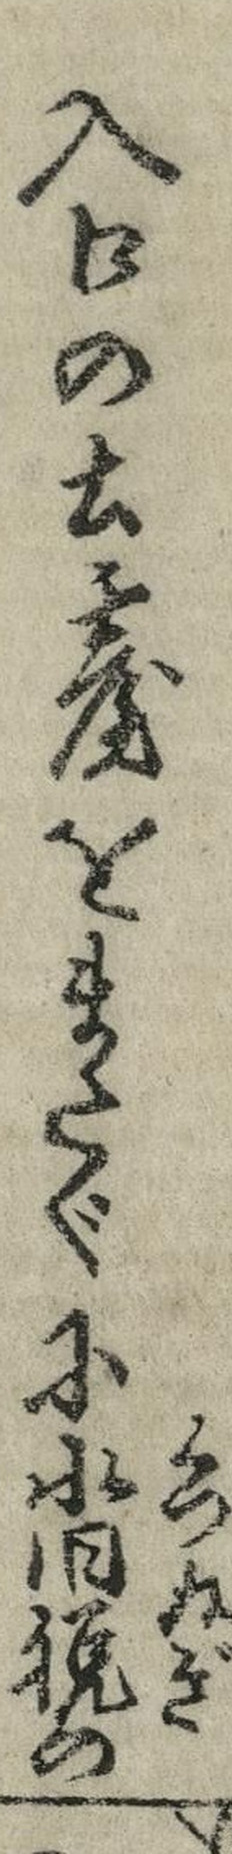入口の土台をまたぐに沓脱の
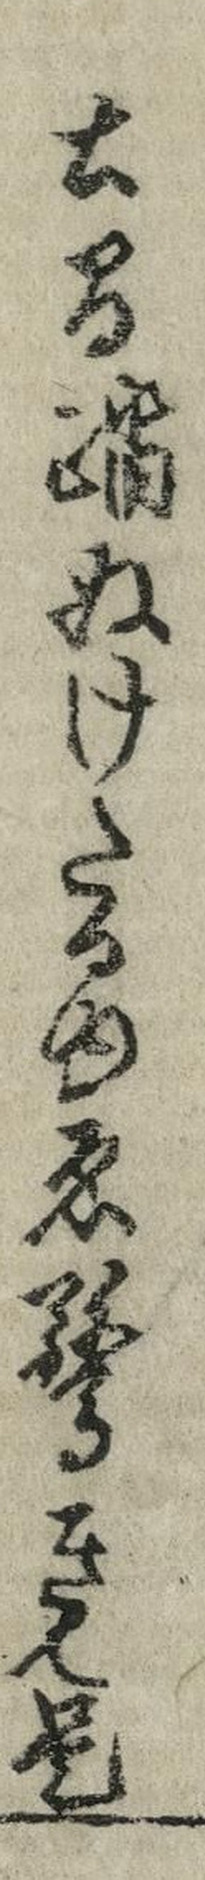土間踏ぬけたるゆゑ驚きて是
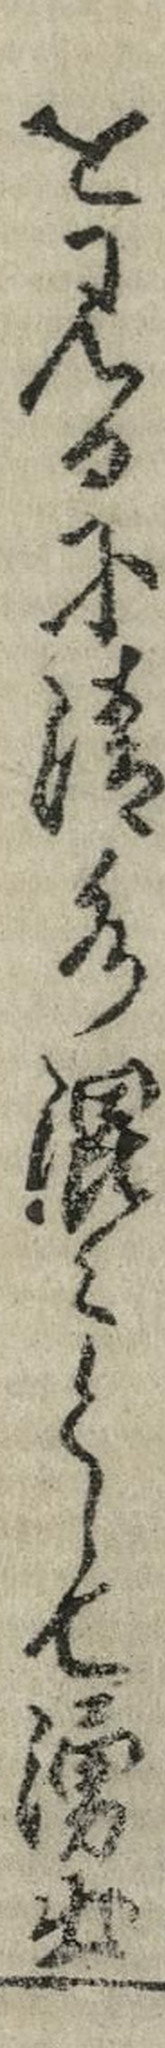を見るに清水混々として湧出
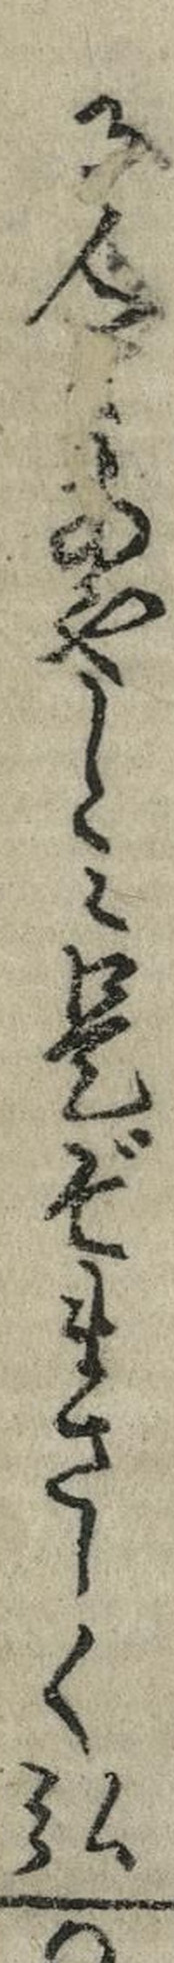る人々あやしみ是ぞまさしく弘
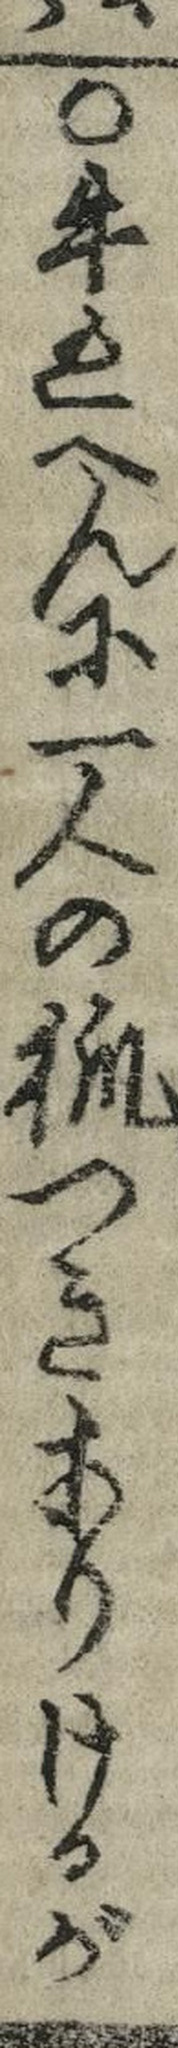○牛込へんに一人の狐つきありけるが
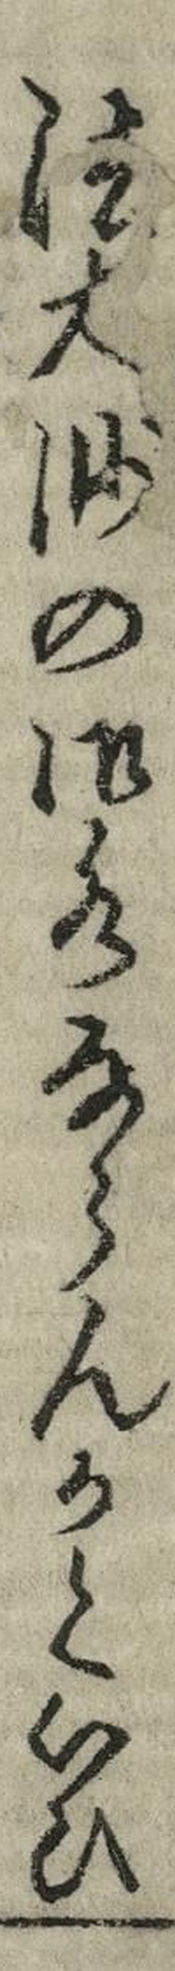法大師の御水ならんかといひ
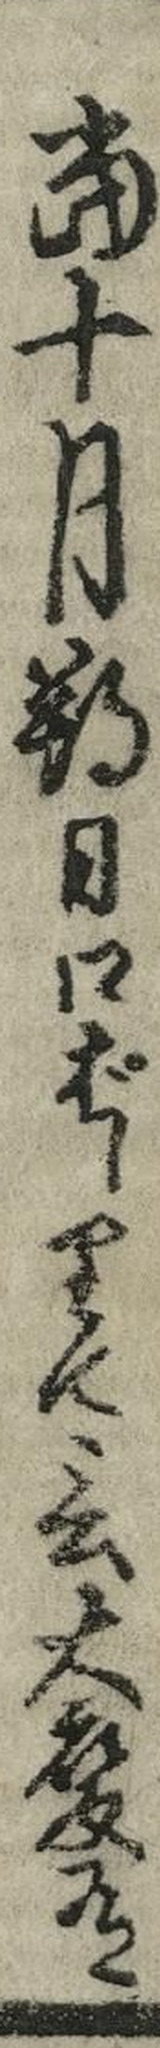当十月朔日口ぱしりて言大変有
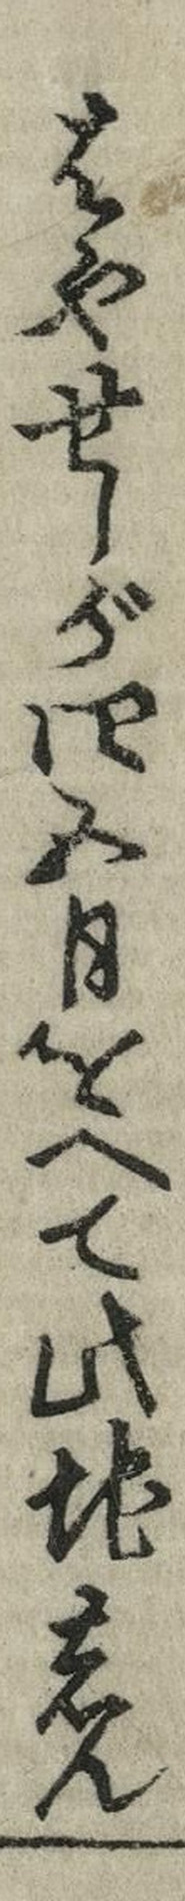はやせしが四五日をへて此地しん
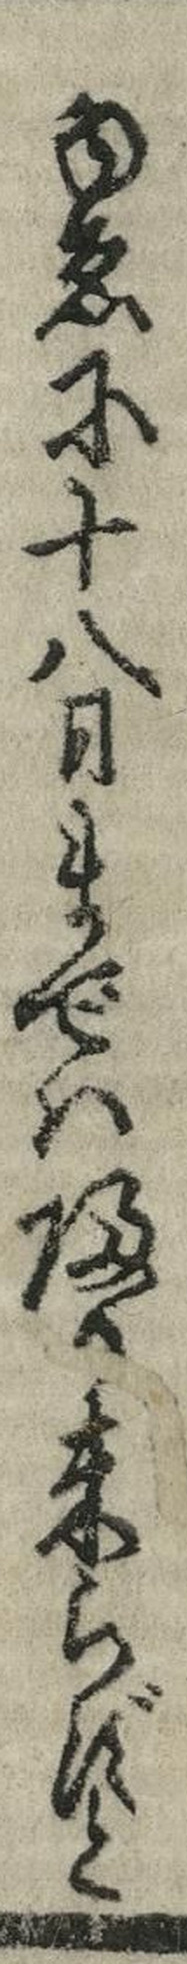ゆゑに十八日までは帰り来らずと
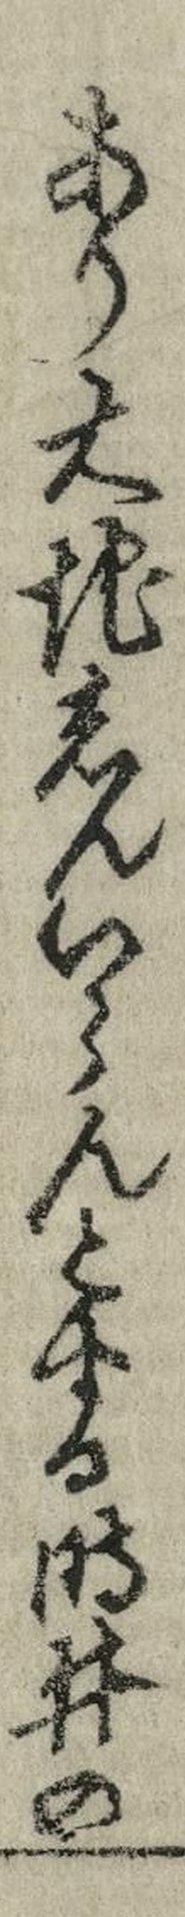あり大地しんいかんとする時井の
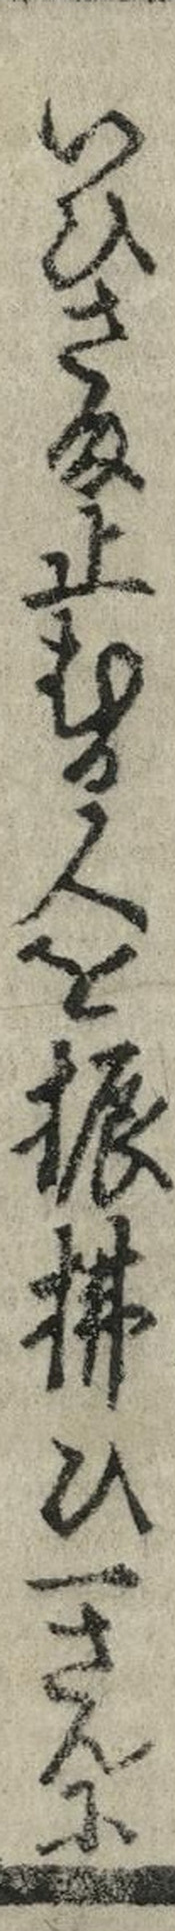いひさま止むる人を振払ひ一さんに
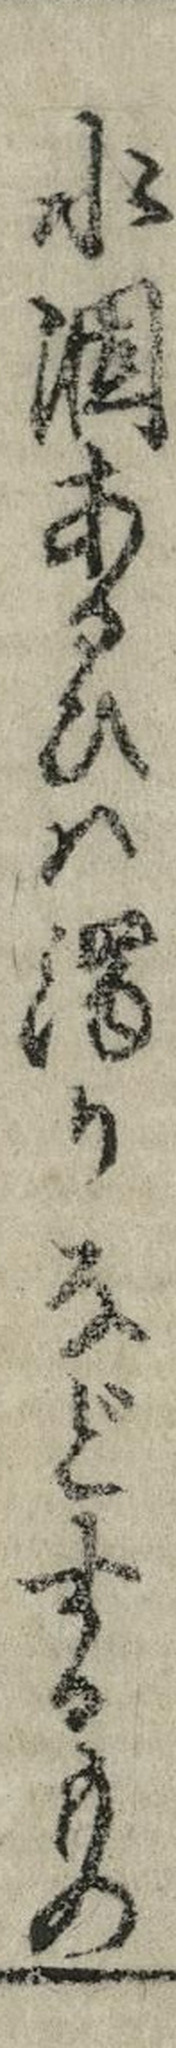水涸あるひは濁りなどするもの
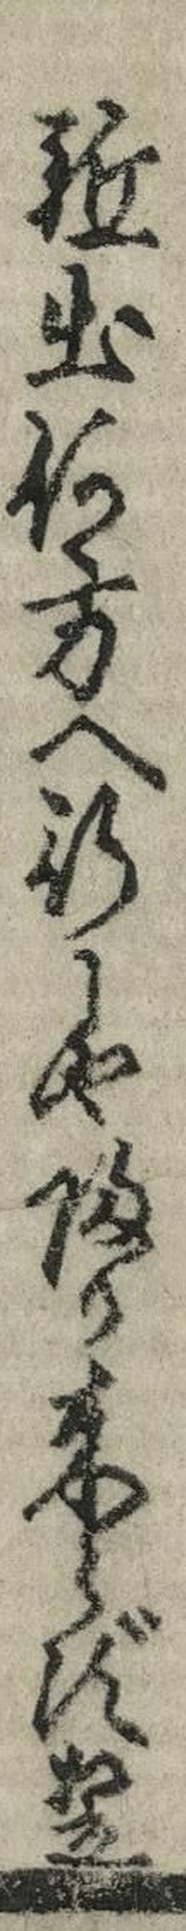駈出何方へ行しや帰り来らず翌
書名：江戸　大地震末代噺の種　全
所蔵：東京大学地震研究所図書室 Earthquake Research Institute Library, The University of Tokyo, JAPAN
